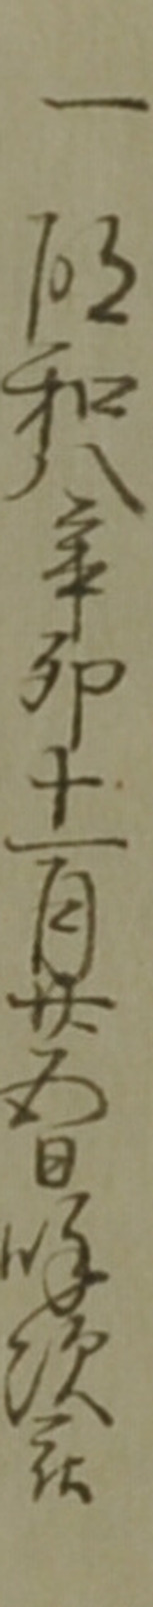一明和八辛卯十一月廿五日呼次被
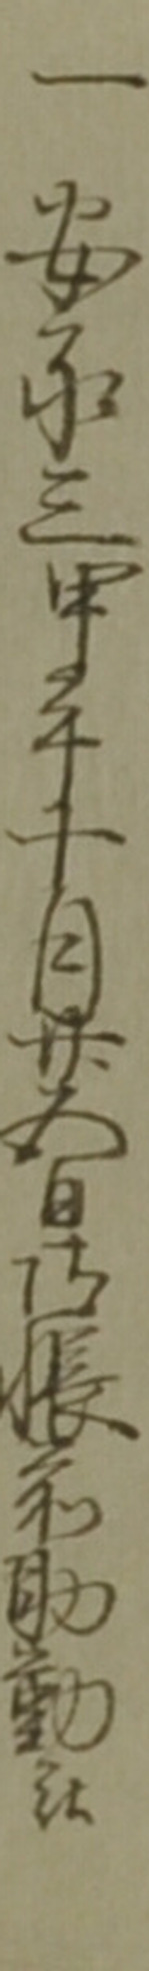一安永三甲午十月廿五日御帳前助勤被
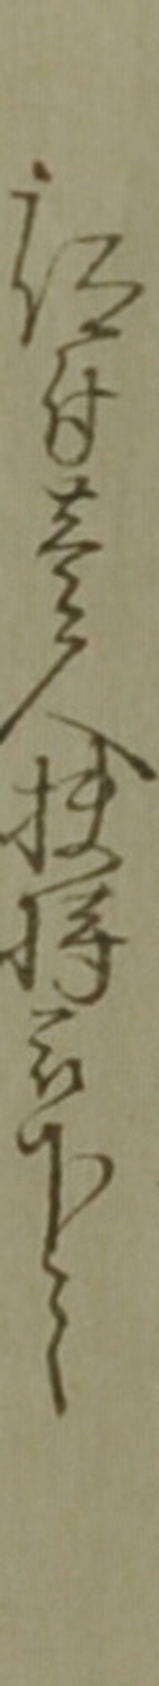仰付壱人扶持被下之
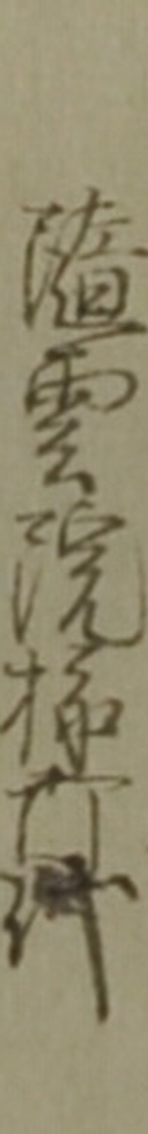隨雲院様御代
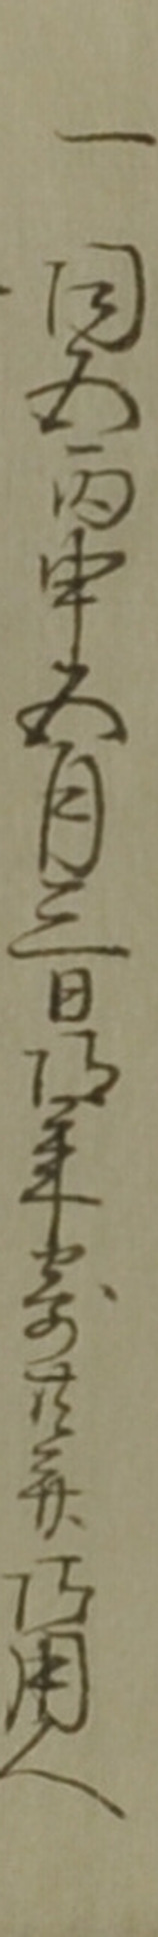一同五丙申五月三日御年寄共并御用人
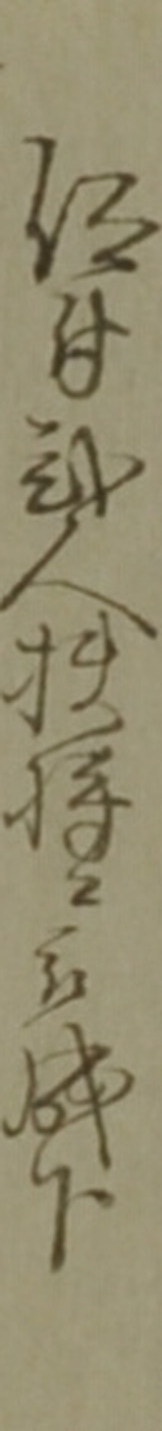仰付弐人扶持被成下
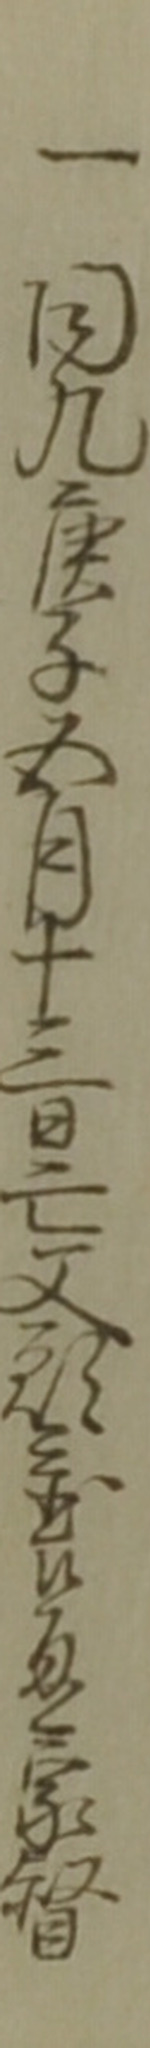一同九庚子五月十三日亡父願置候通家督
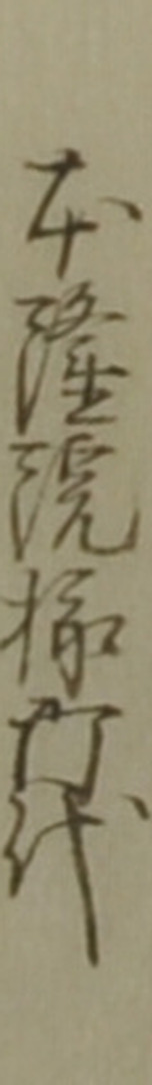本隆院様御代
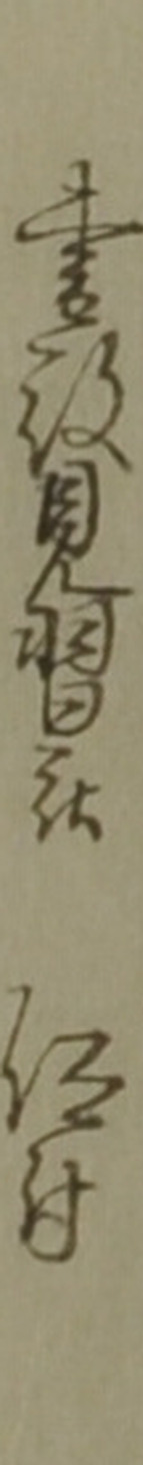書役見習被仰付
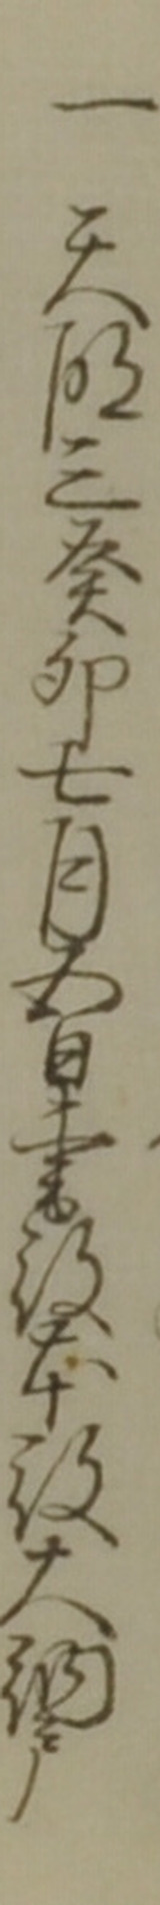一天明三癸卯七月五日書役本役大納戸
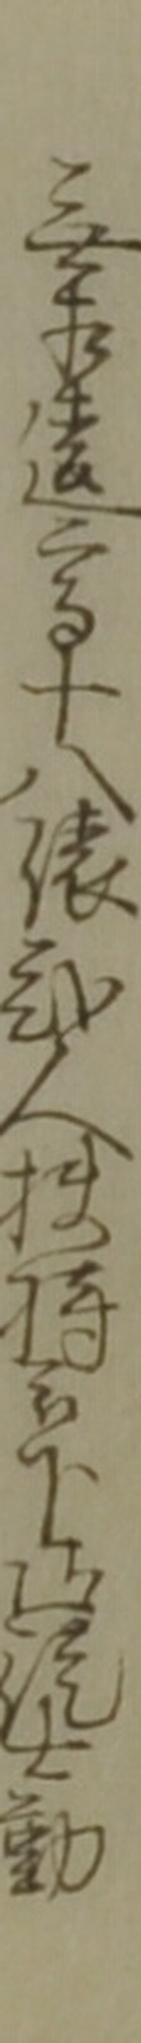無相違高十八俵弐人扶持被下御徒士勤
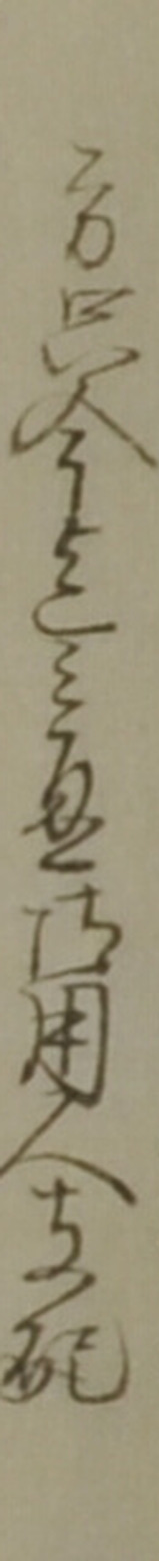方只今迄之通御用人支配
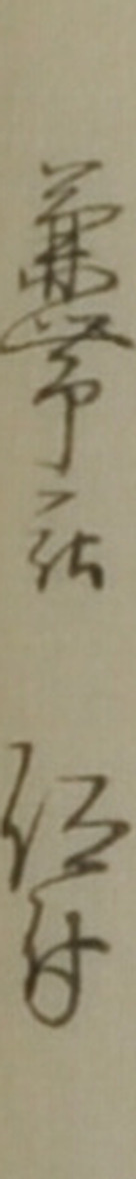兼帯被仰付
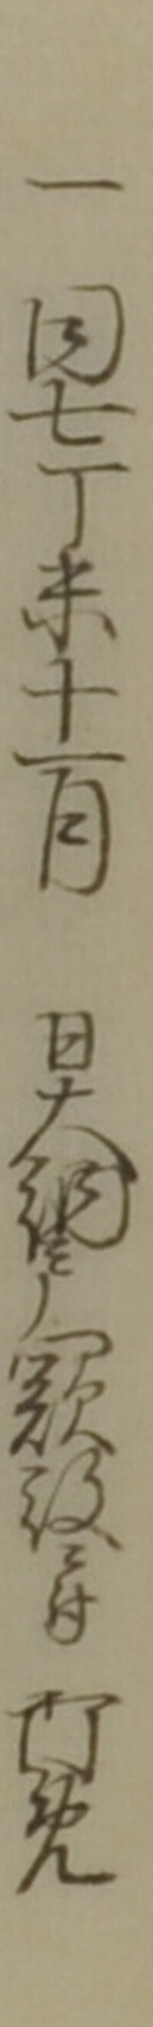一同七丁未十一月日大納戸闕役ニ付御免
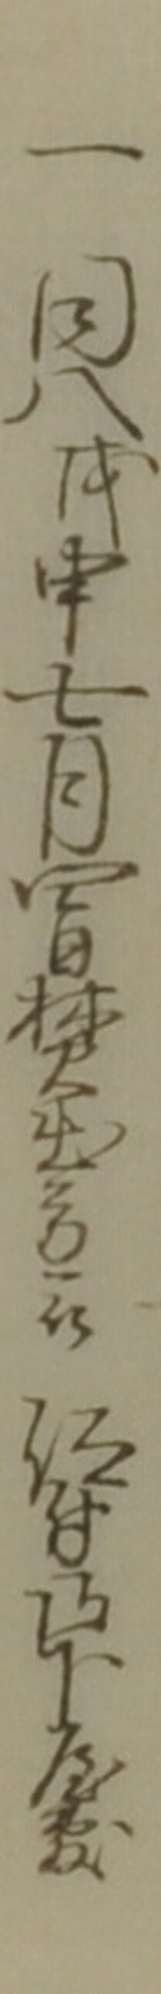一同八戊申七月四日焚出方被仰付御下屋敷
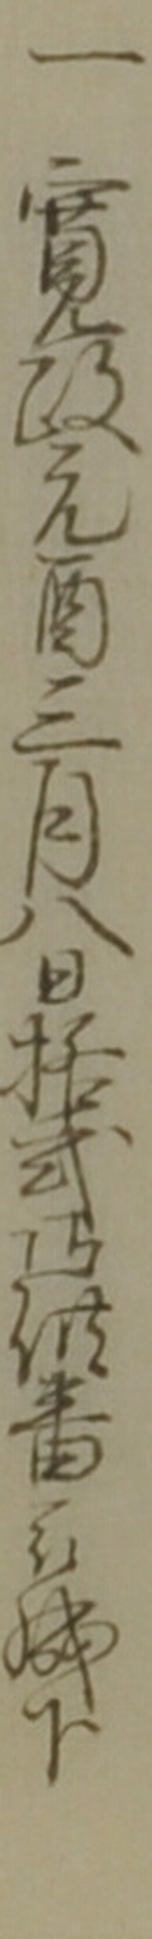一寛政元酉三月八日格式御供番被成下
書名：無足廃家（弐）
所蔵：伊那市立高遠町図書館・合同会社AMANE
